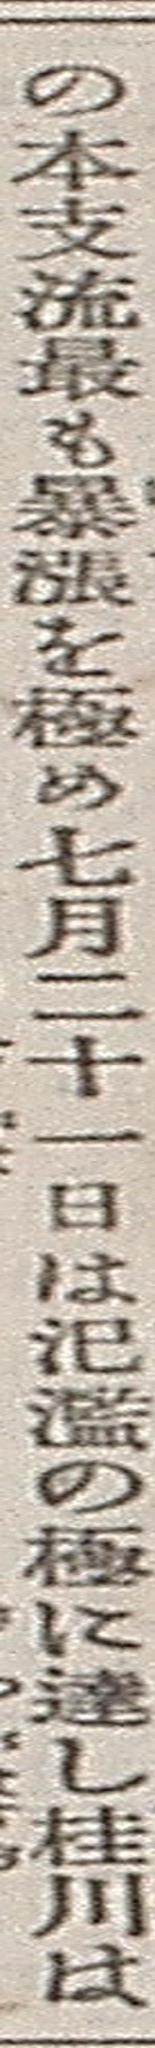の本支流最も暴漲を極め七月二十一日は氾濫の極に達し桂川は
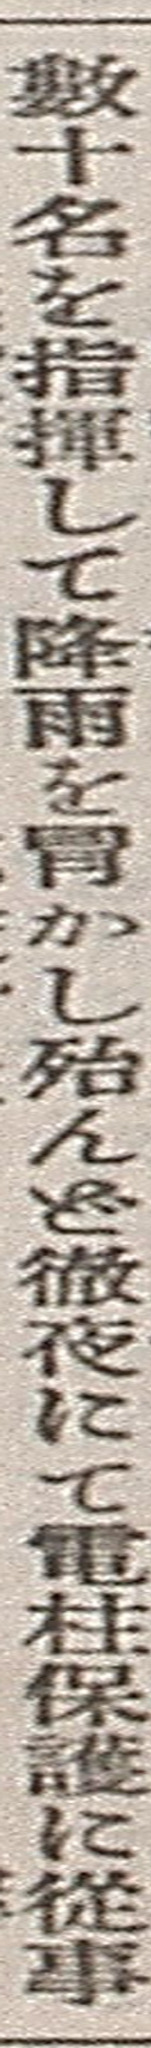数十名を指揮して降雨を冒かし殆んど徹夜にて電柱保護に従事
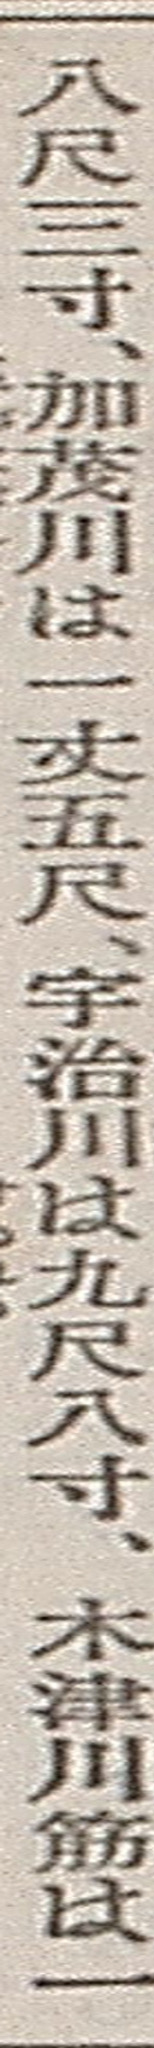八尺三寸、賀茂川は一丈五尺、宇治川は九尺八寸、木津川筋は一
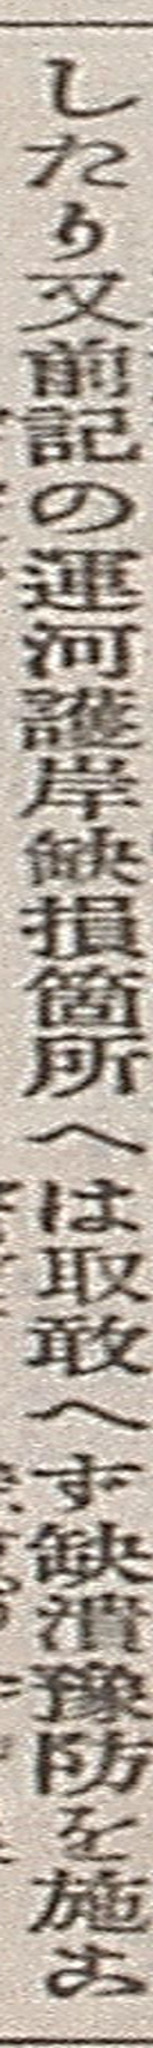したり又前記の運河護岸缺損箇所へは取敢へず缺損予防を施こ
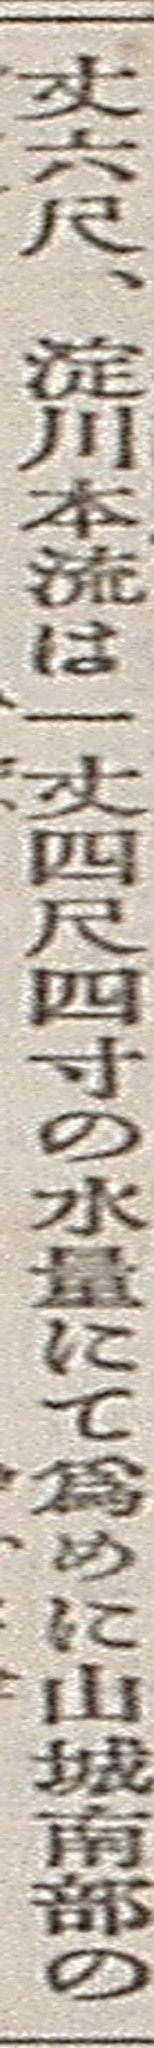丈六尺、淀川本流は一丈四尺四寸の水量にて為めに山城南部の
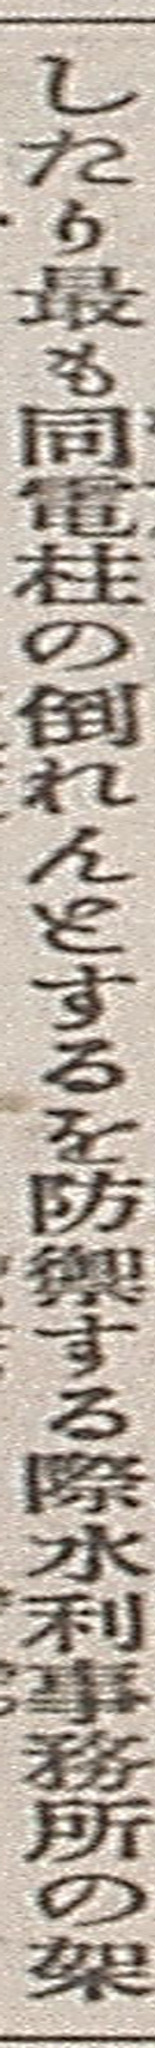したり最も同電柱の倒れんとするを防禦する際水利事務所の架
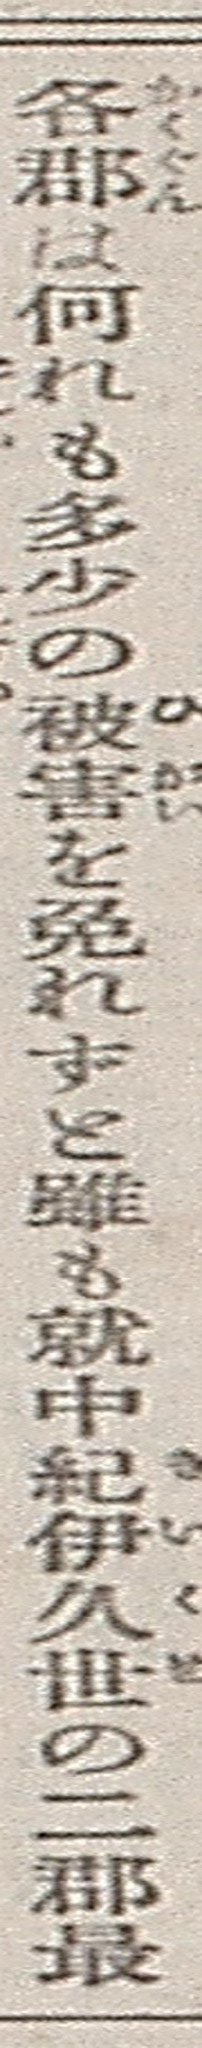各郡は何れも多少の被害を免れずと雖も就中紀伊久世の二郡最
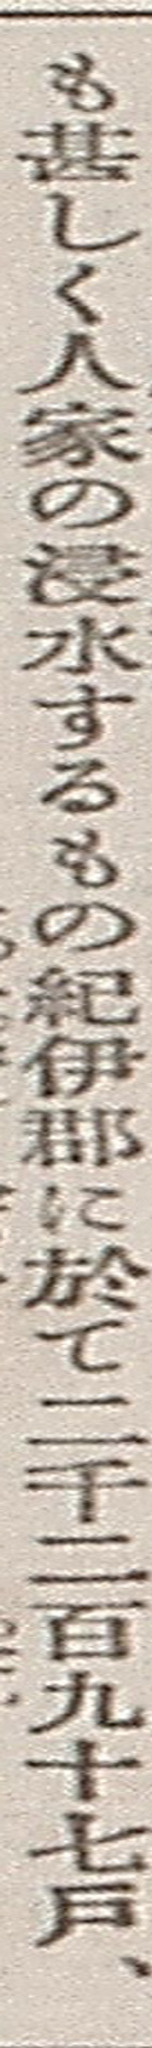も甚しく人家の浸水するもの紀伊郡に於て二千二百九十七戸、
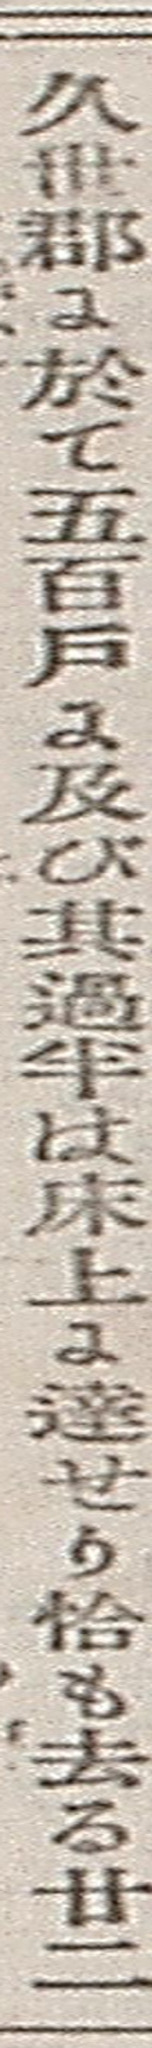久世郡に於て五百戸に及び其過半は床上に達せり恰も去る廿二
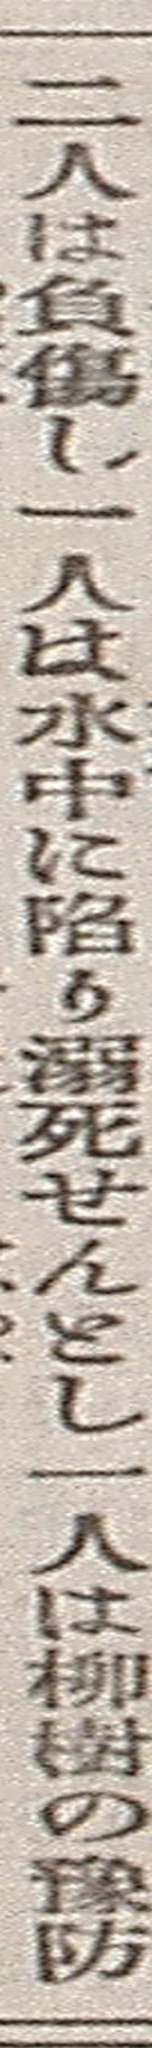二人は負傷し一人は水中に陥り溺死せんとし一人は柳樹の予防
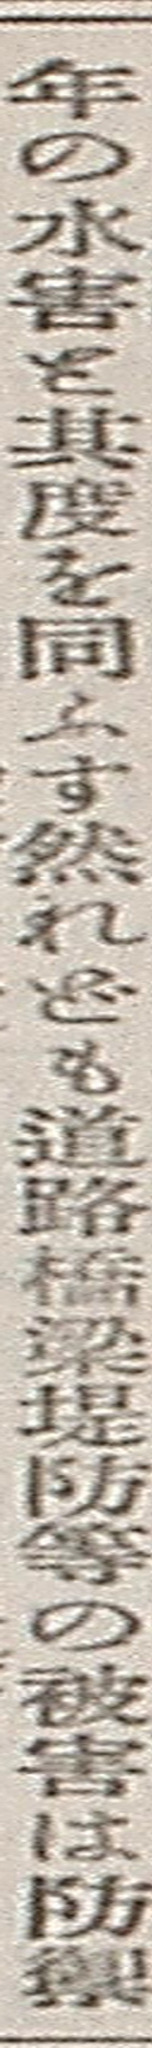年の水害と其度を同ふす然れども道路橋梁堤防等の被害は防禦
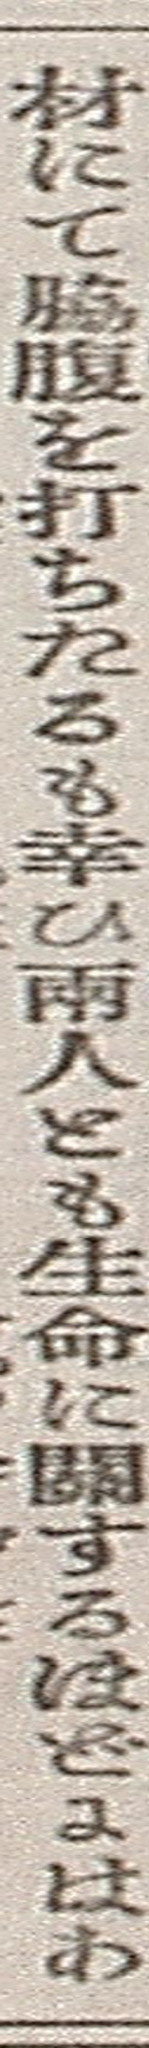材にて脇腹を打ちたるも幸ひ両人とも生命に関するほどにはあ
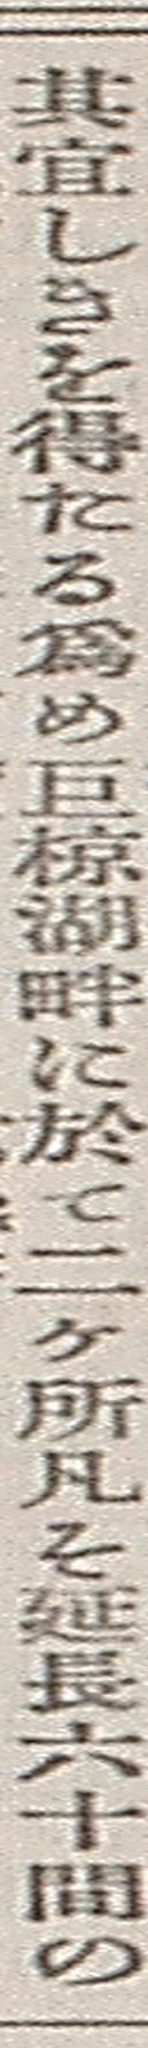其宜しきを得たる為め巨椋湖畔に於て二ヶ所凡そ延長六十間の
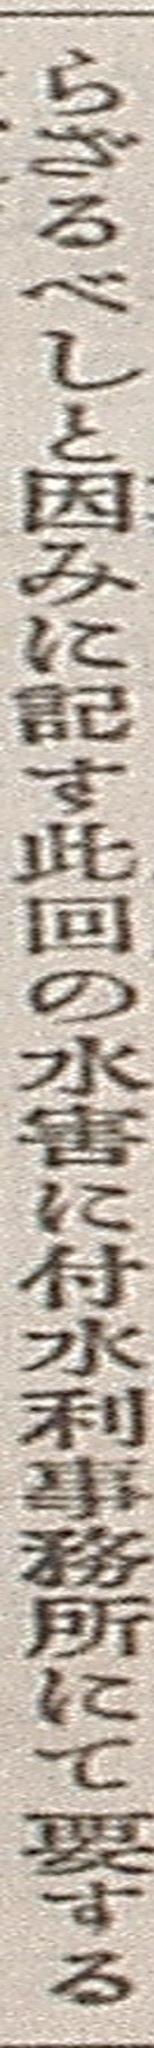らざるべしと因みに記す此回の水害に付水利事務所にて要する
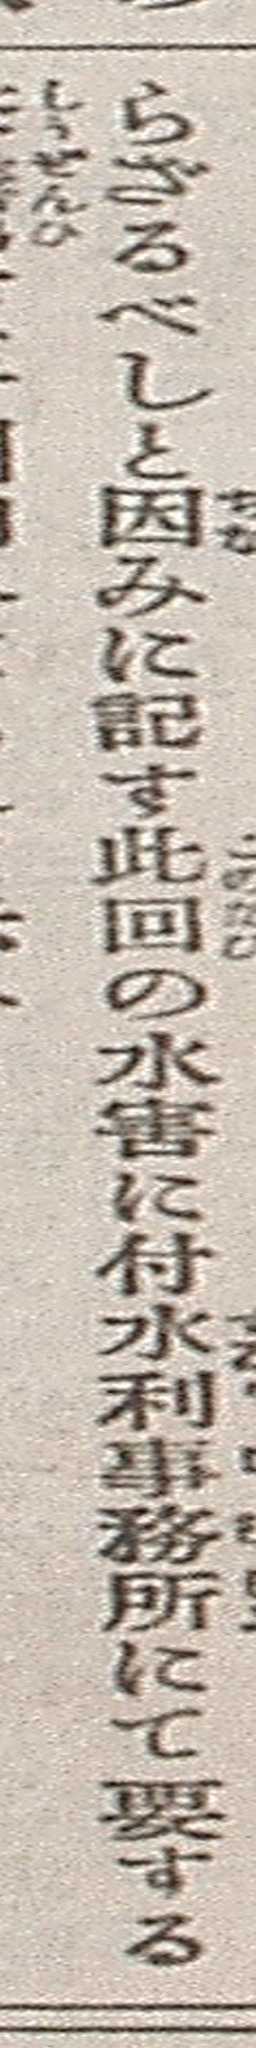らざるべしと因みに記す此回の水害に付水利事務所にて要する
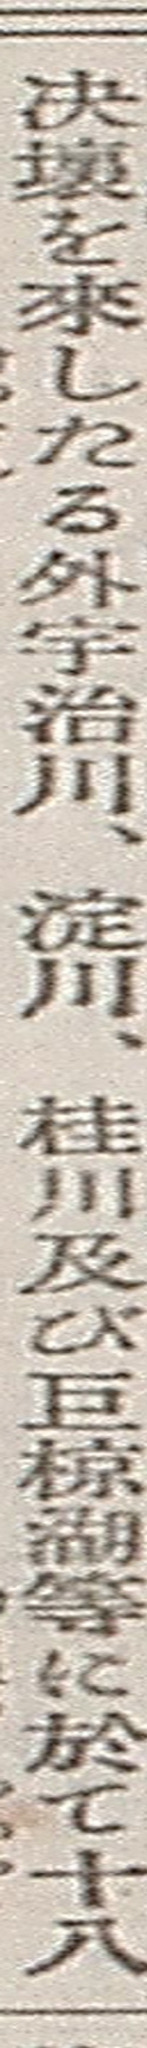决壊を来したる外宇治川、淀川、桂川及び巨椋湖等に於て十八
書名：風俗畫報臨時増刊第百二十八號　洪水被害録（下）
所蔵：東京大学地震研究所図書室 Earthquake Research Institute Library, The University of Tokyo, JAPAN
